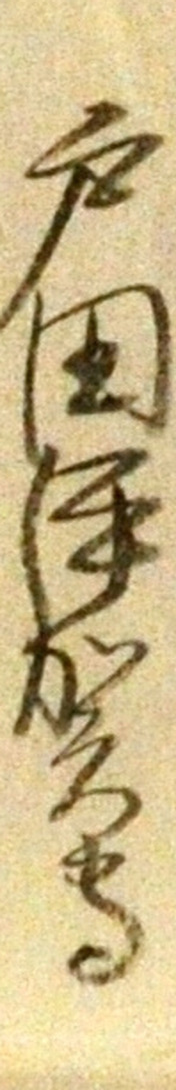戸田伊賀守
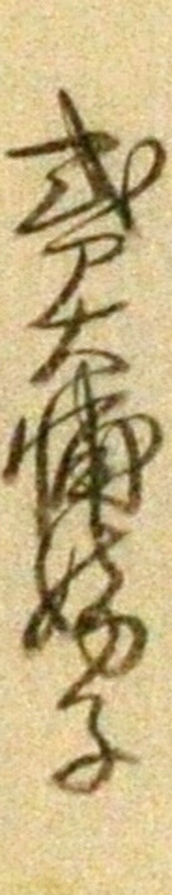式部大輔嫡子
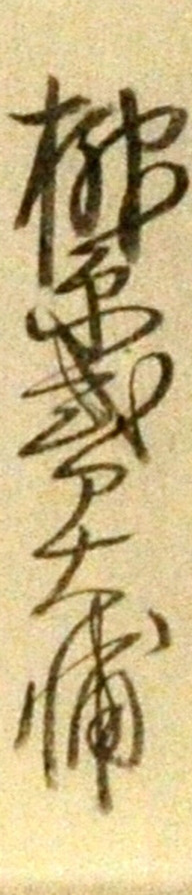柳原式部大輔
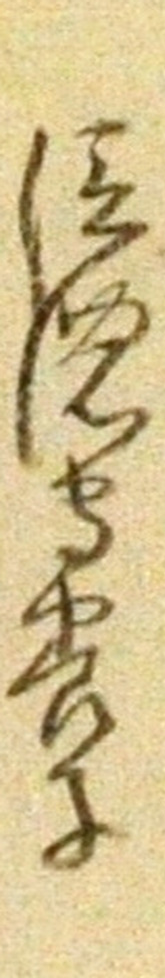信濃守養子
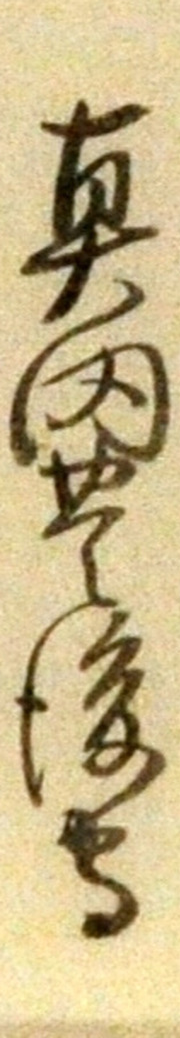真田豊後守
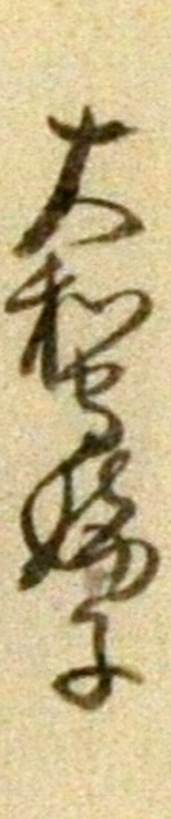大和守嫡子

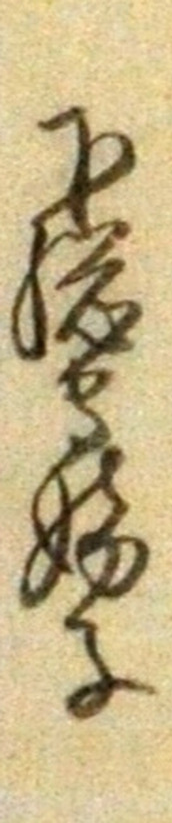下総守嫡子
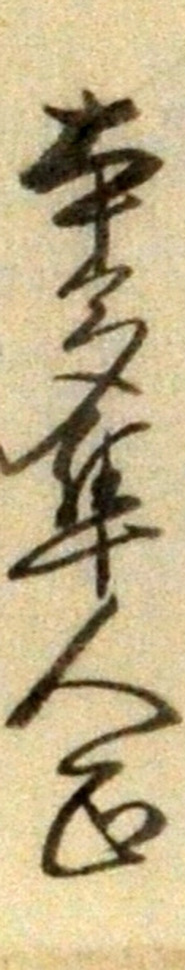本多隼人正
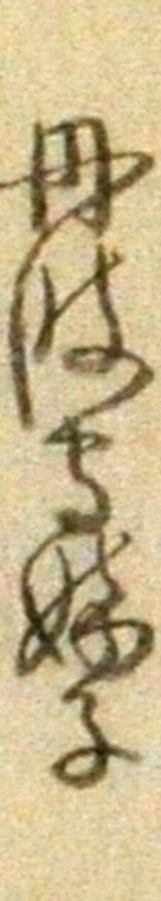丹波守嫡子
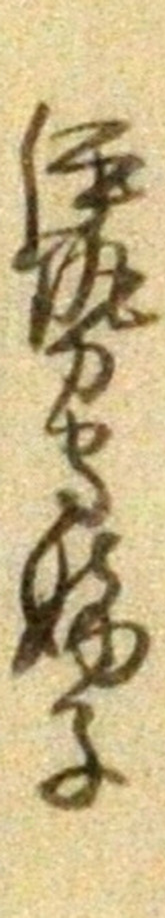伊勢守嫡子
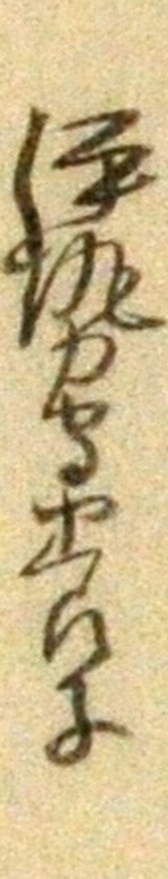伊勢守養子
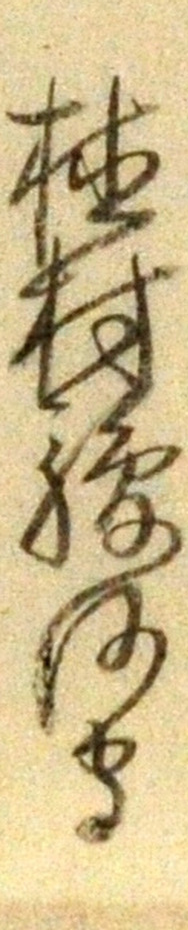植村駿河守
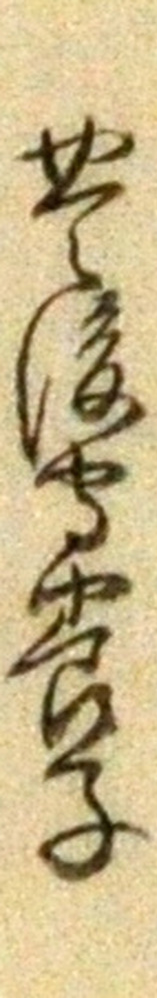豊後守養子
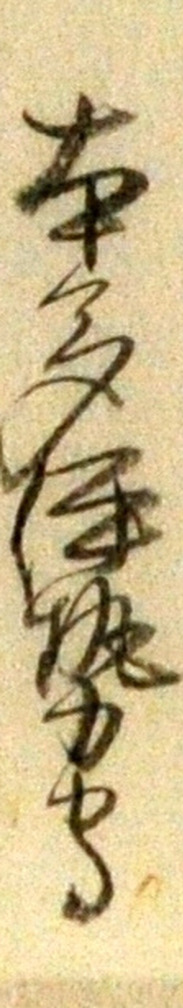本多伊勢守
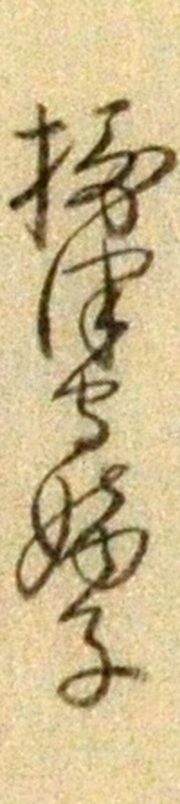摂津守嫡子
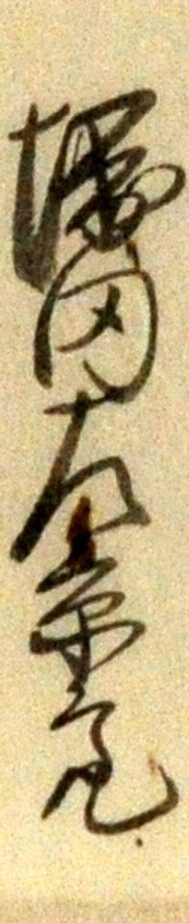堀田左京亮
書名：御馳走御能ノ節ノ留外
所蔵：伊那市立高遠町図書館・合同会社AMANE
